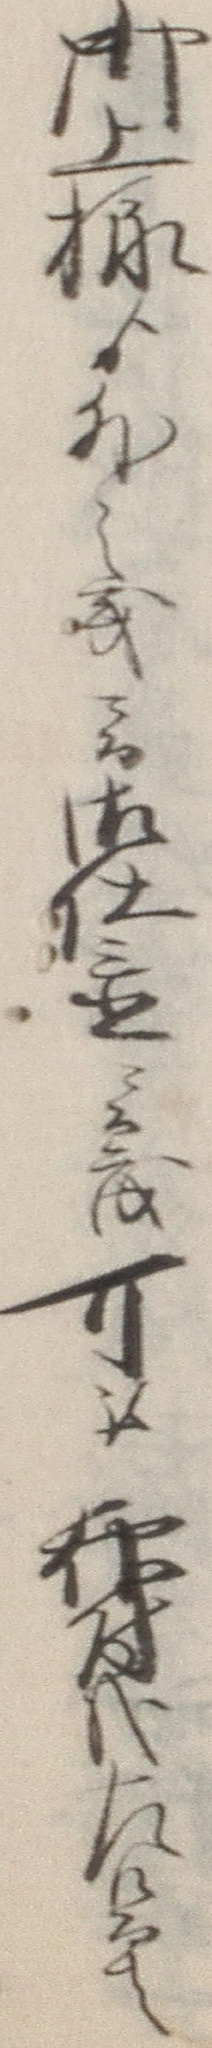御上様ゟ外之義ニ而御仕置ニ而も可被仰付哉左候而は
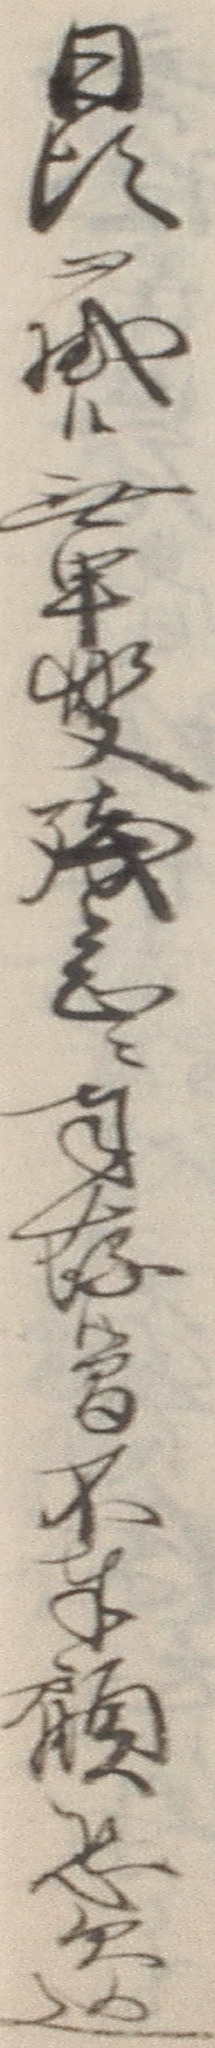日頃ヲ掛ル無甲斐残念ニ奉存候間不奉顧恐欠込
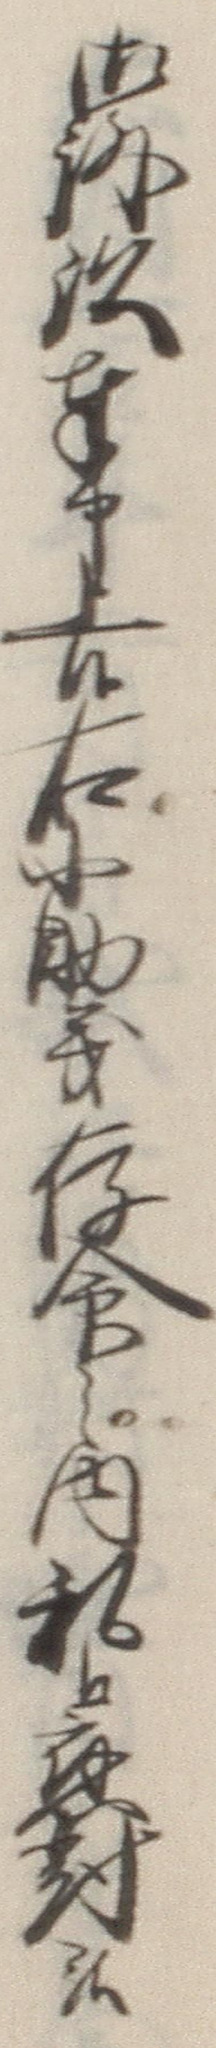御訴訟奉申右小助義存命之内私え応対被
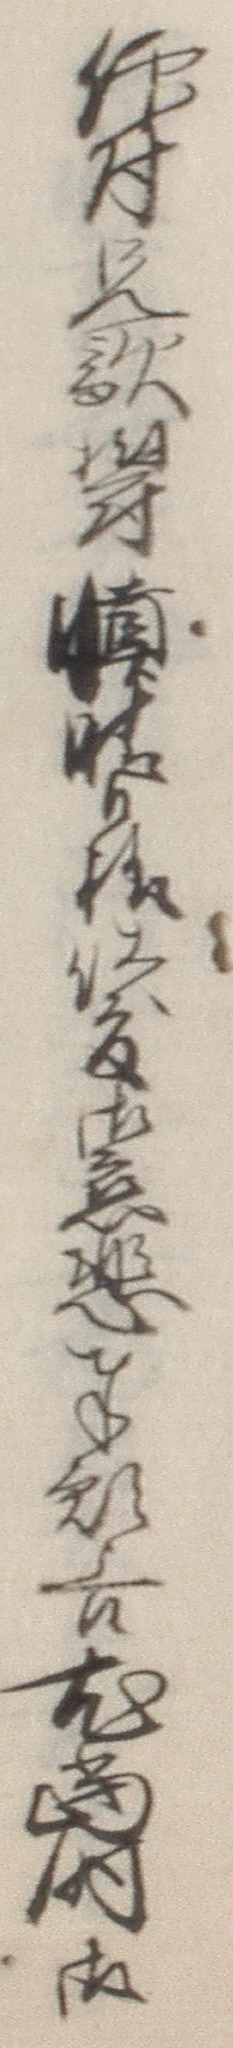仰付兄敵鬱憤晴候様仕度御慈悲奉願上候尤当時御
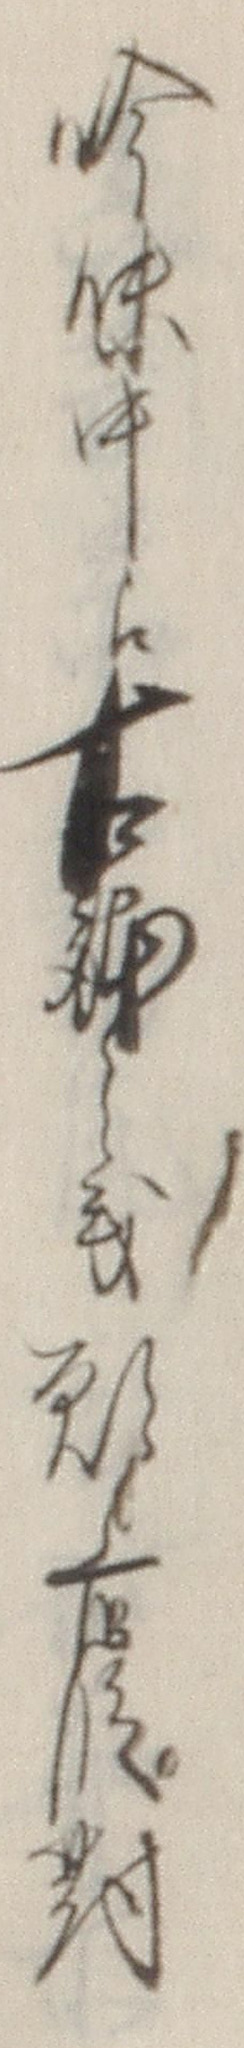吟味中え右躰之義願上候段対
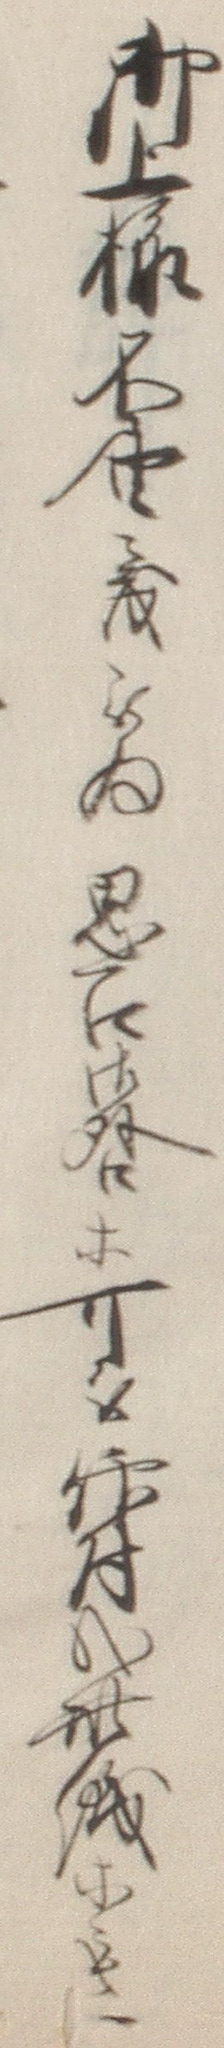御上様不届之義被為思召御咎等可被仰付哉此儀等も
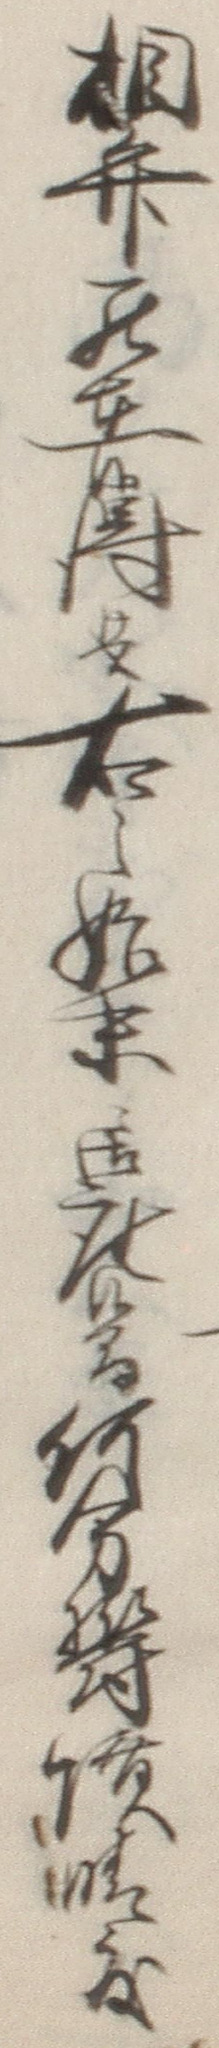相弁罷在候得共右之始末ニ御座候間何分鬱憤晴度
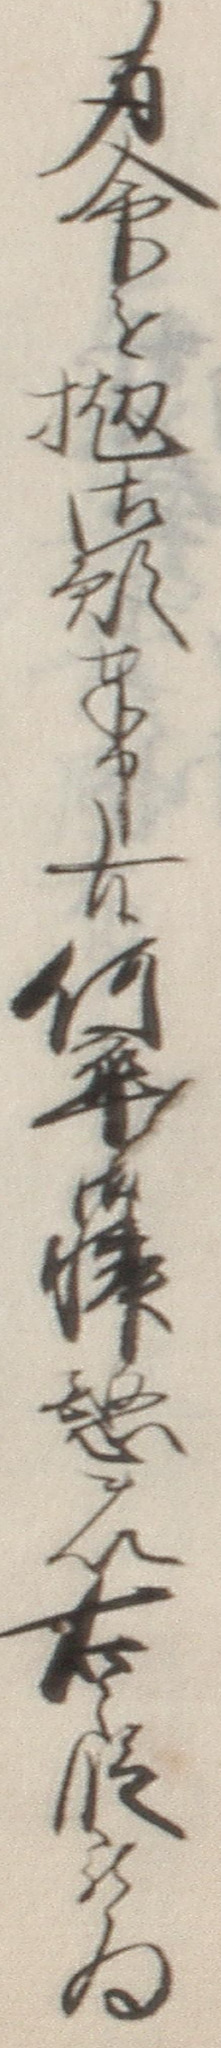身命を抛御願奉申上候何卒御憐憫ヲ以右の段被為
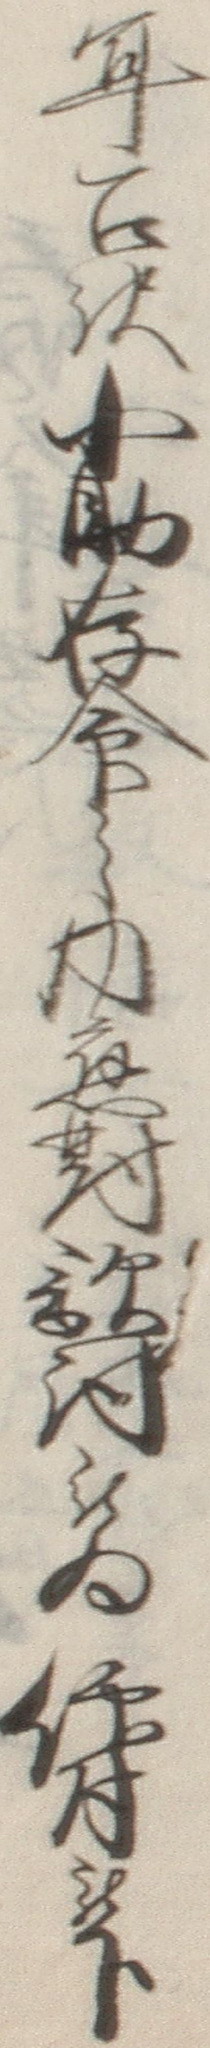聞召訳小助存命之内応対敵討被為仰付被下
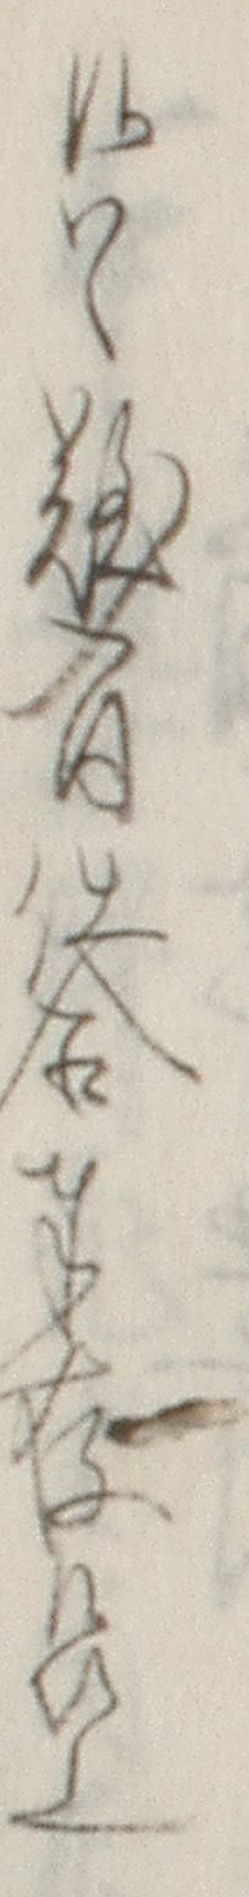候ハヽ難有仕合奉存候以上
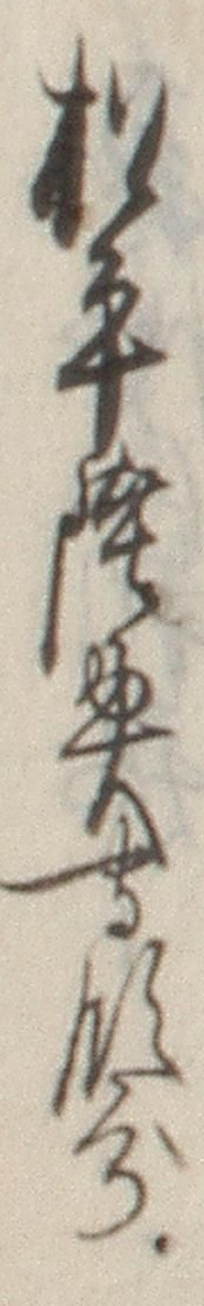松平陸奥守領分

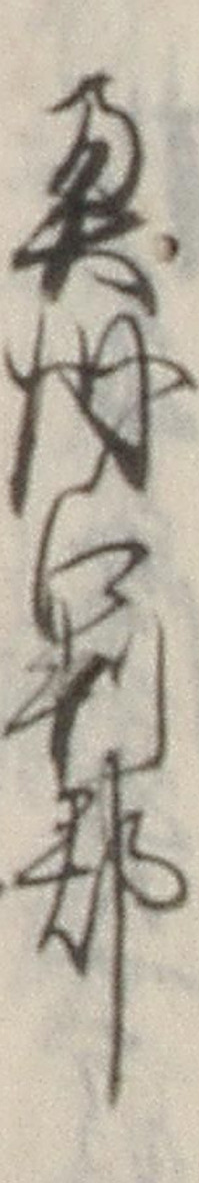奥州江刺郡
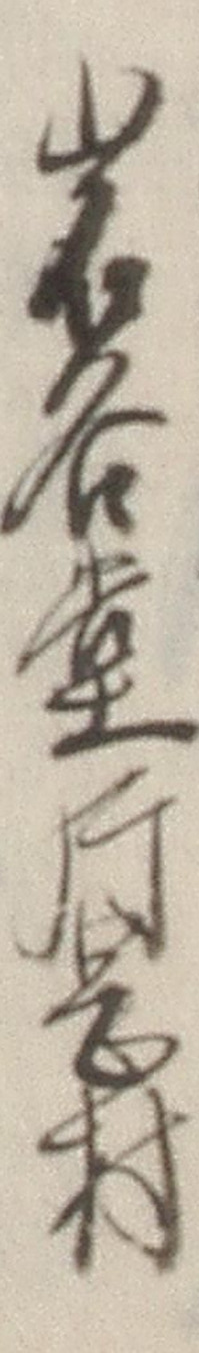岩谷堂片岡村
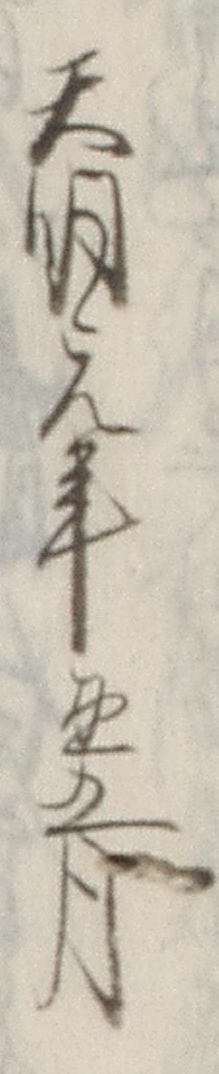天明元年丑九月
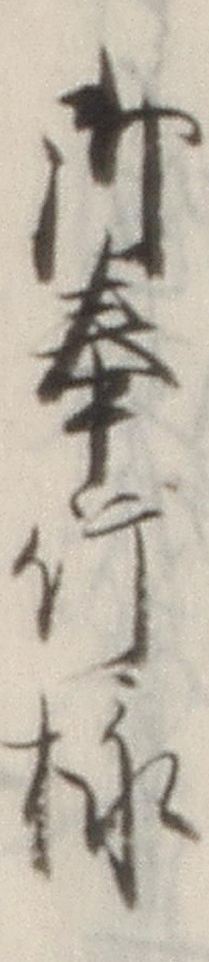御奉行様
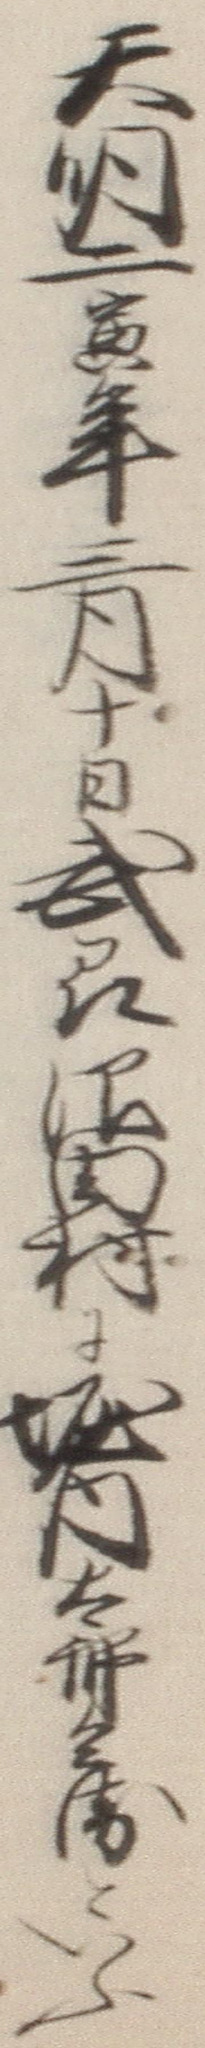天明二寅年三月十日武州沼田村に堀内太郎兵衛といふ
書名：[諸国災害記録]
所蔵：東京大学地震研究所図書室 Earthquake Research Institute Library, The University of Tokyo, JAPAN
